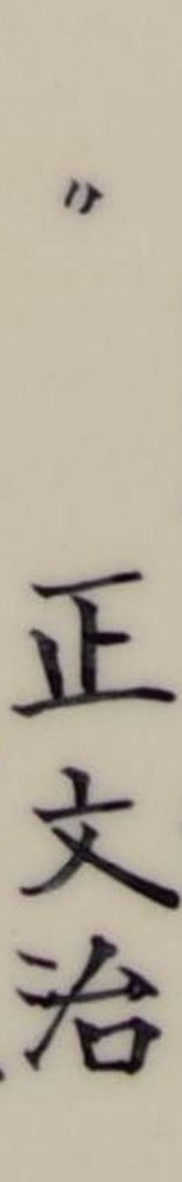正文治
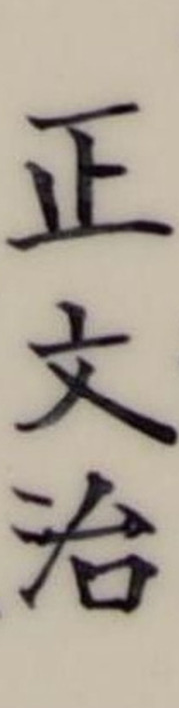正文治
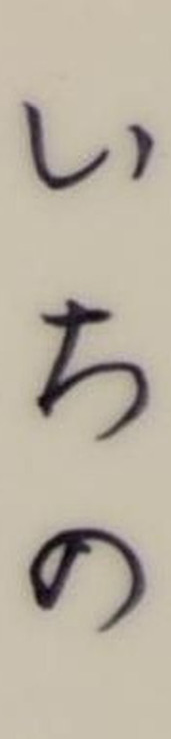いちの

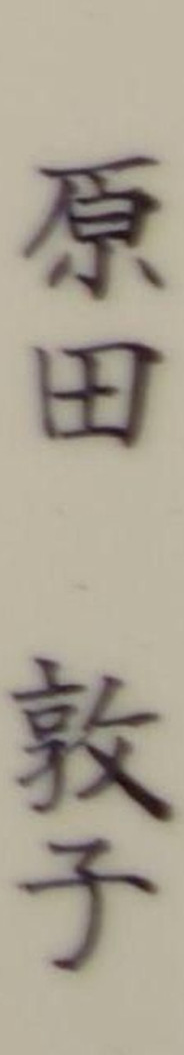原田敦子
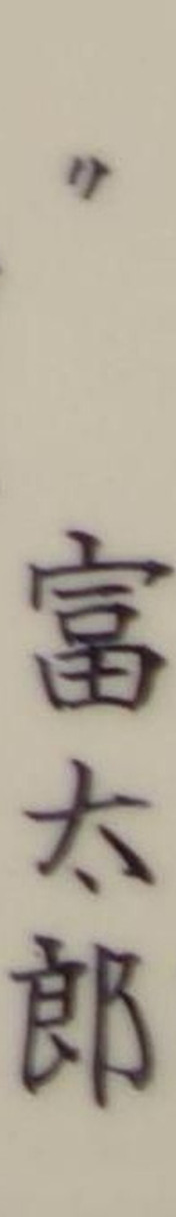富太郎
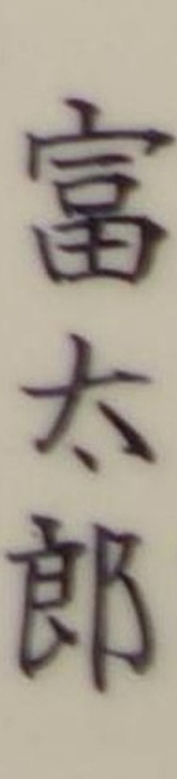富太郎
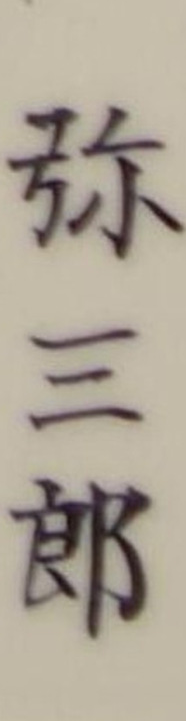弥三郎
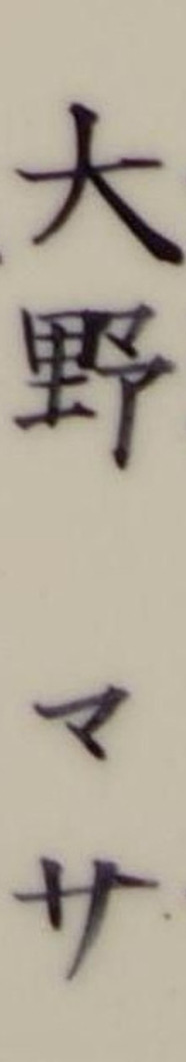大野マサ
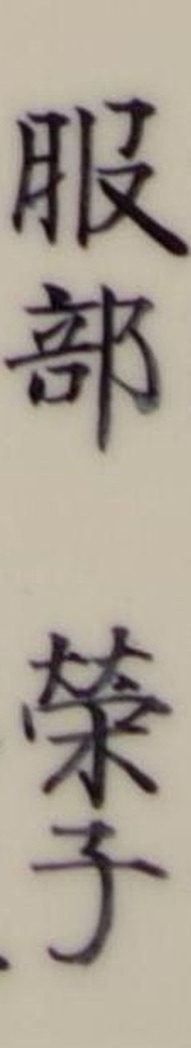服部榮子
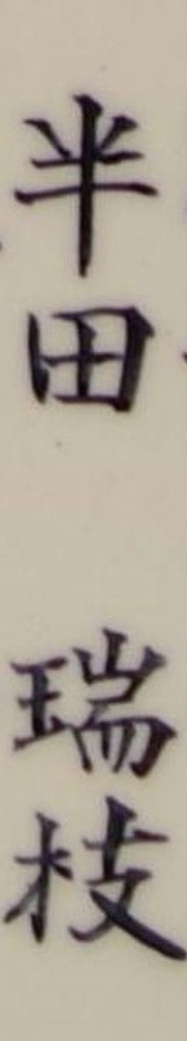半田瑞枝
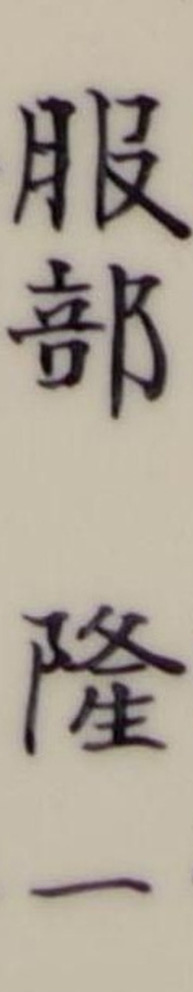服部隆一
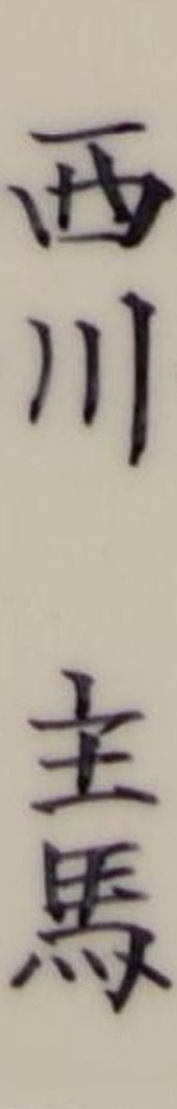西川主馬
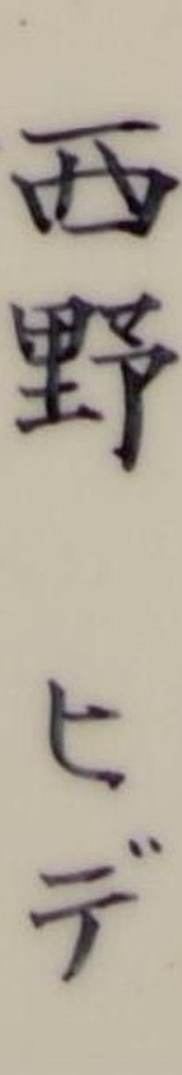西野ヒデ
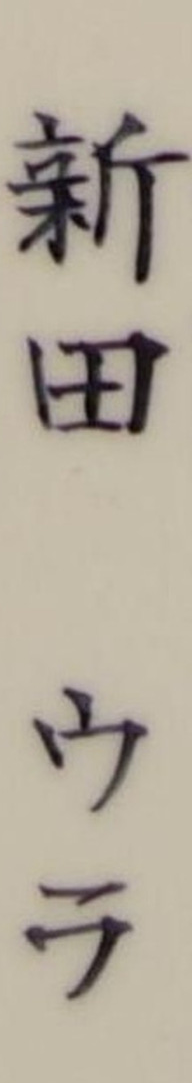新田ウラ
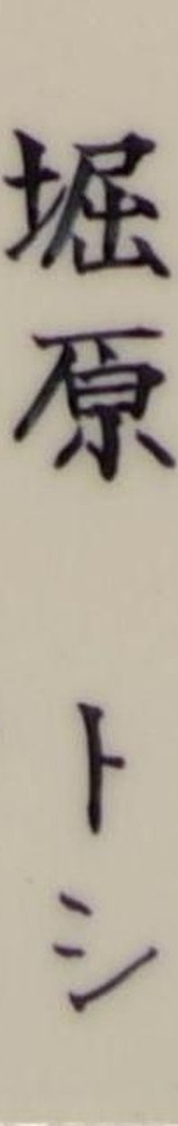堀原トシ
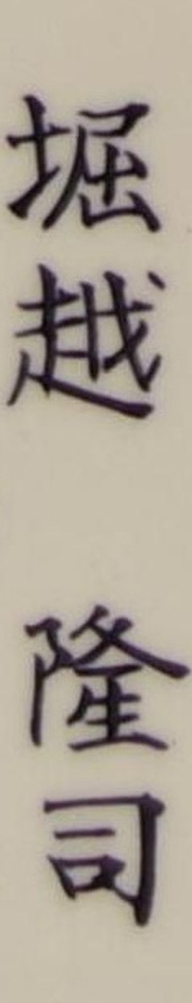堀越隆司
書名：M~S
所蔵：高野山金剛峯寺
